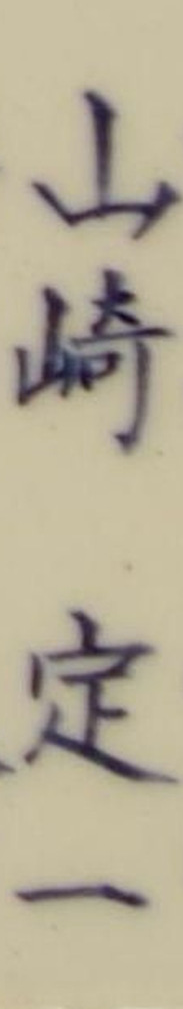山崎定一
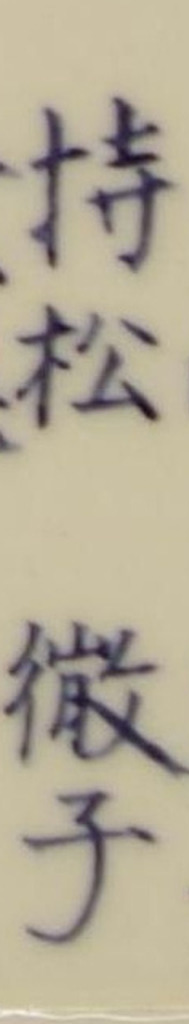持松微子
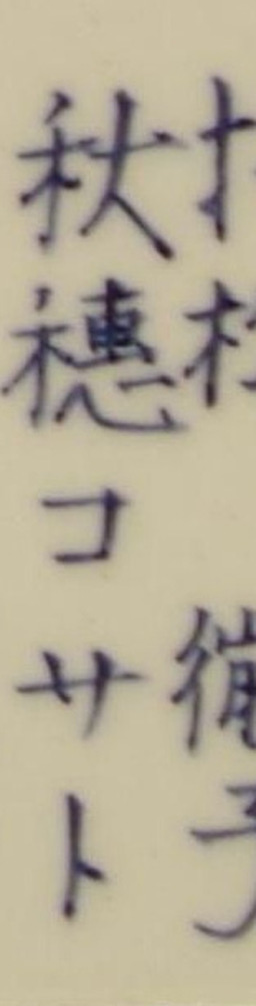秋穂コサト
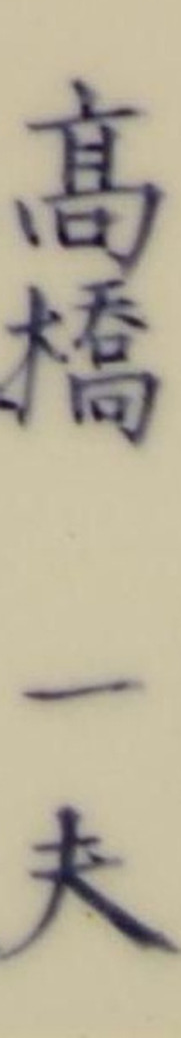高橋一夫
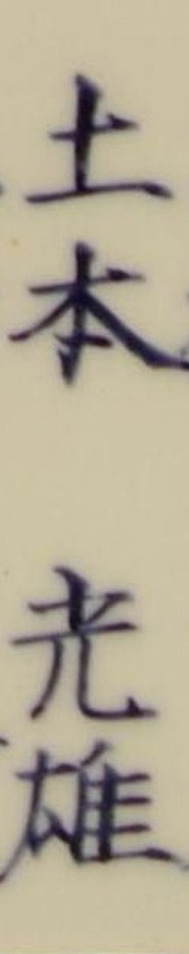土本光雄
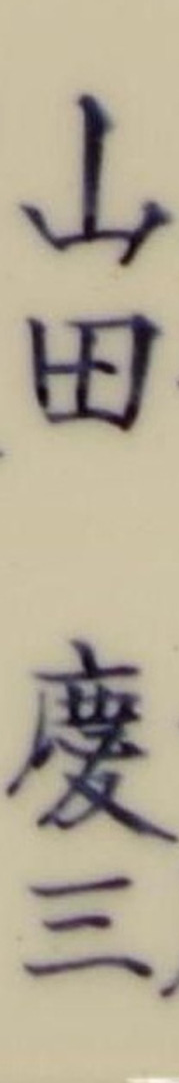山田慶三
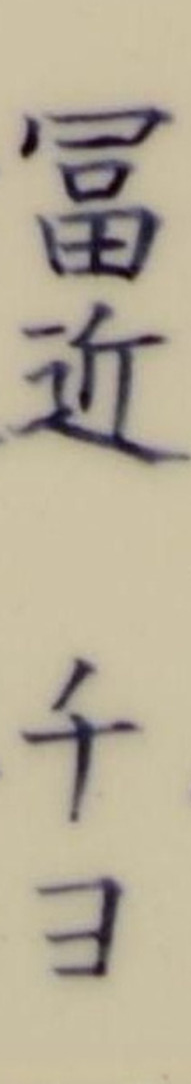冨近チヨ
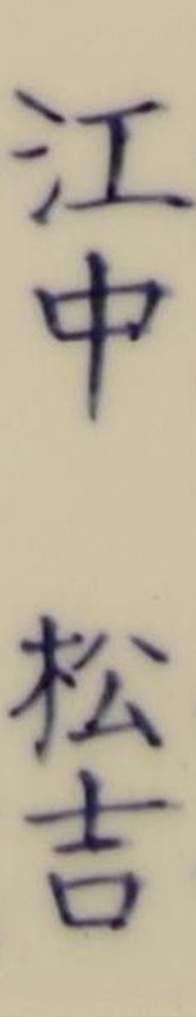江中松吉
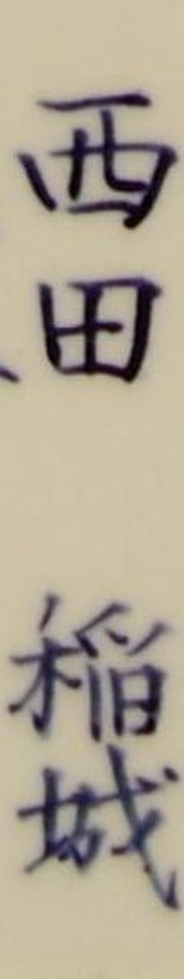西田稲城
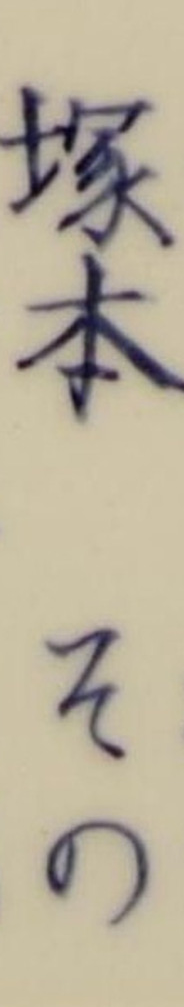塚本その
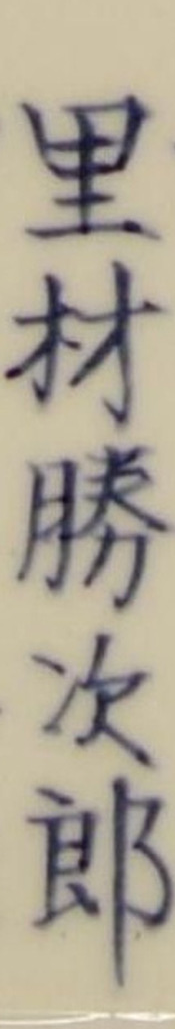里材勝次郎
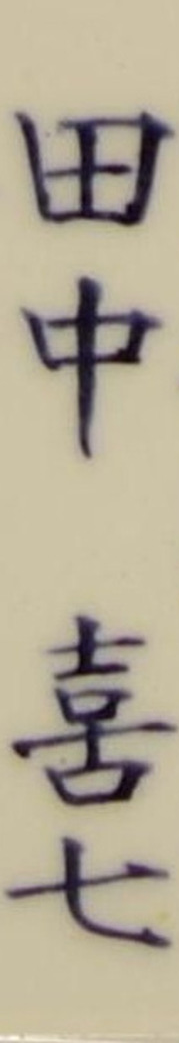田中喜七
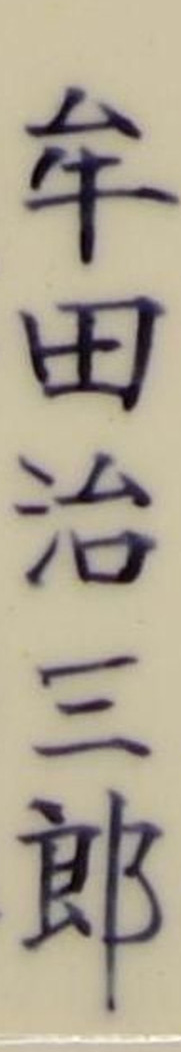牟田治三郎
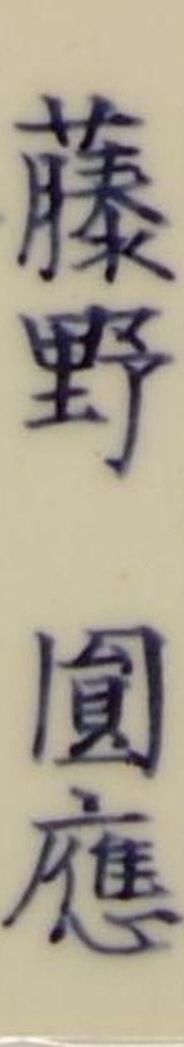藤野円應
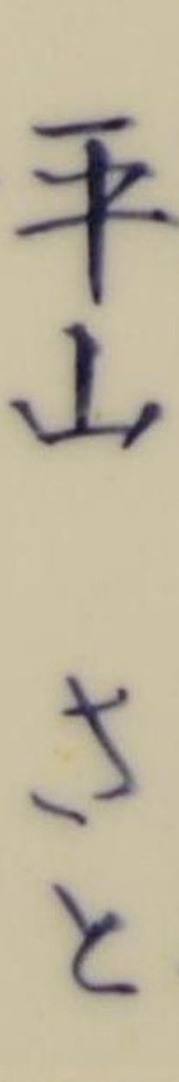平山さと
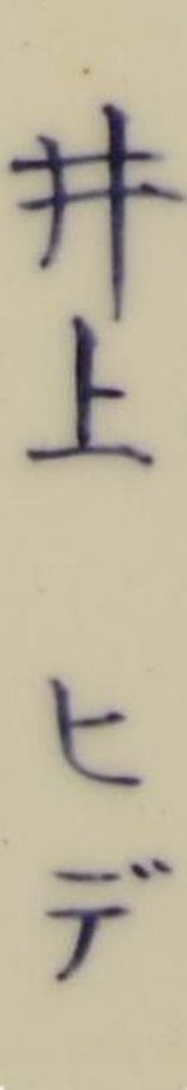井上ヒデ
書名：E~L
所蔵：高野山金剛峯寺
